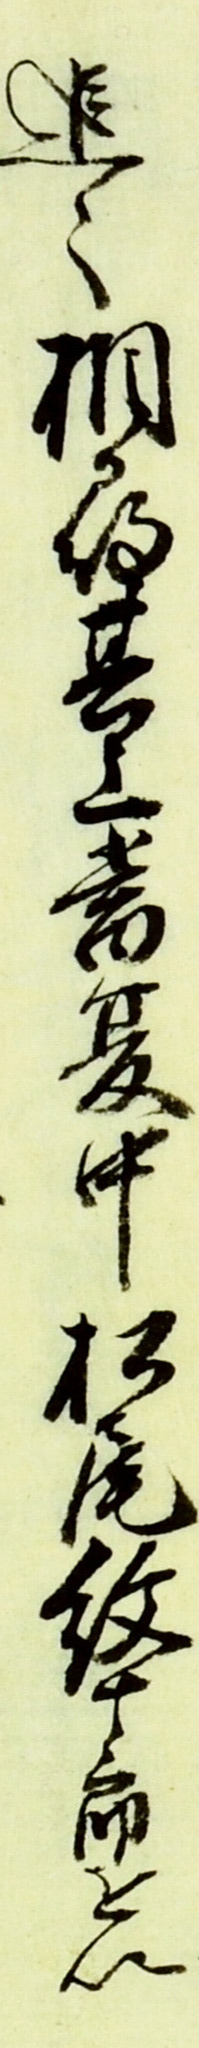追々相尋其上当夏中松尾紋十郎を以
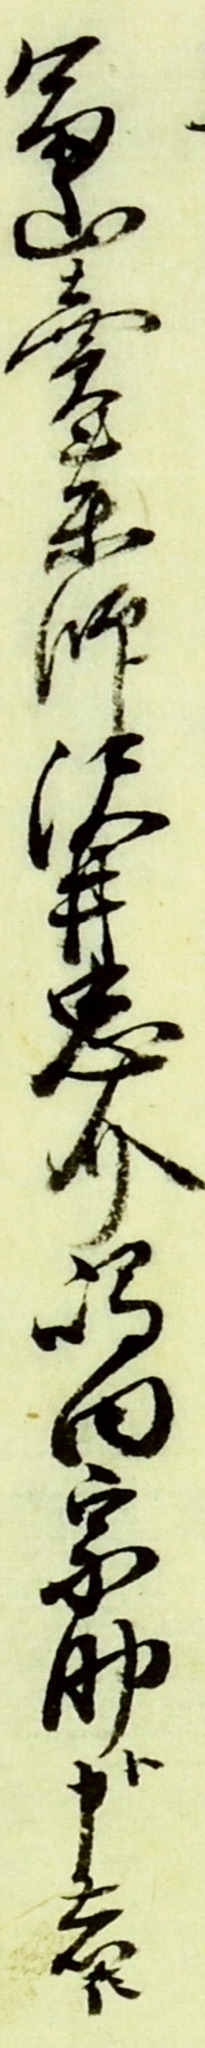冨山売薬師沢井忠介鳴田宗助ト申者共
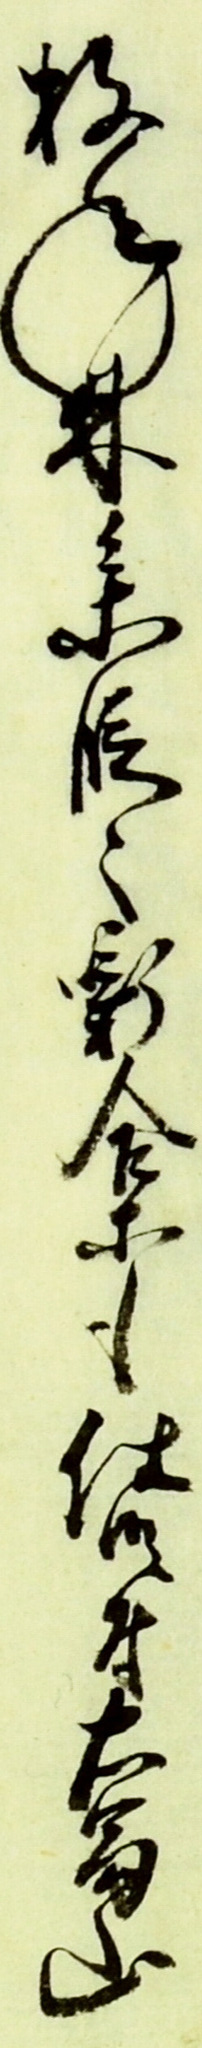数年来参段々新合等も仕候ニ付右冨山

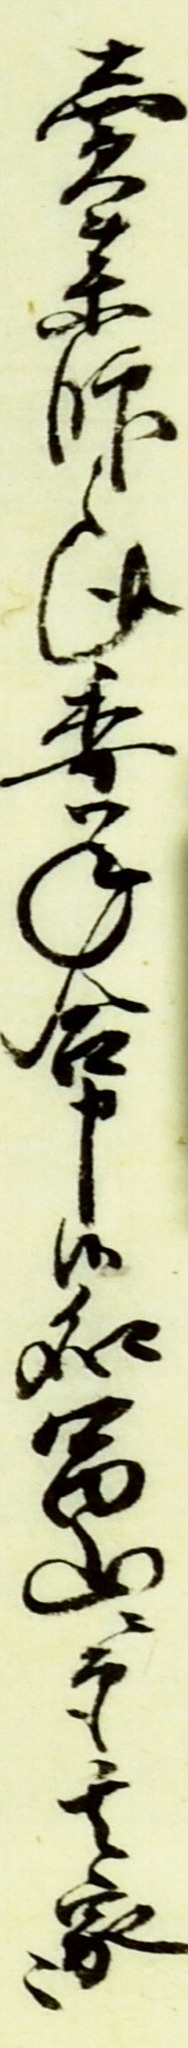売薬師之趣委承合申候処冨山ニ而も其家々
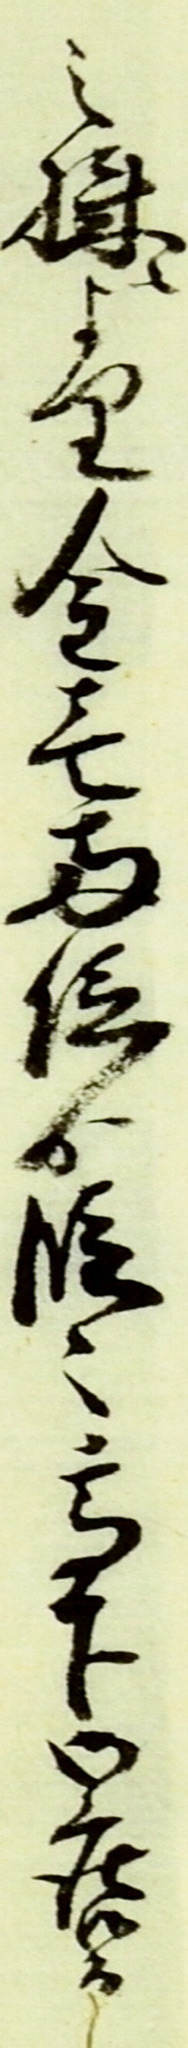之株ニより金壱両位ゟ段々高下御座候而
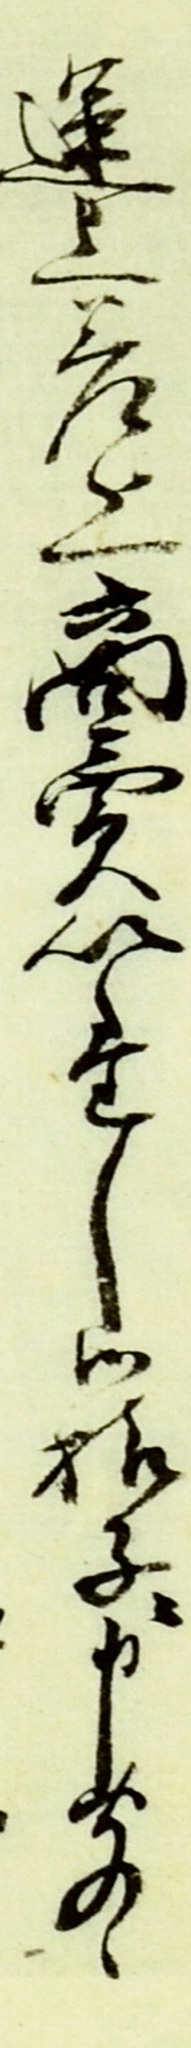運上差上商売いたし候様子ニ申聞候
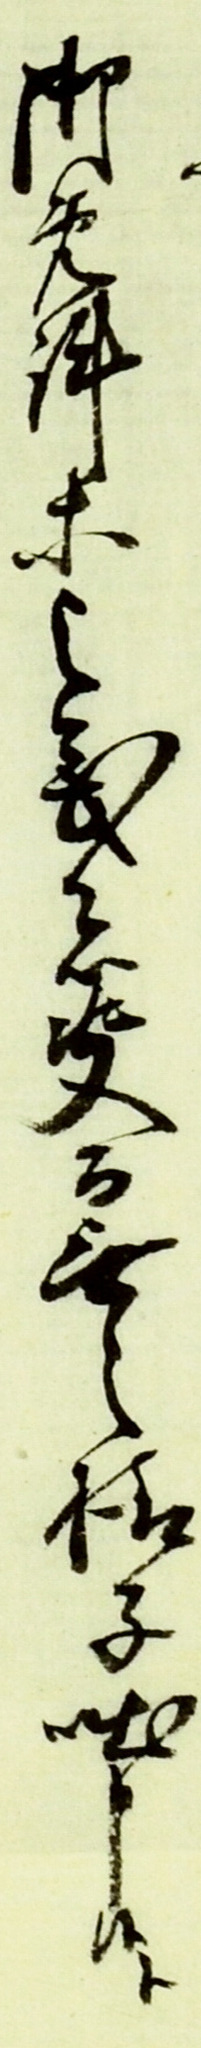御免許等之義者決而無之様子咄申候ト
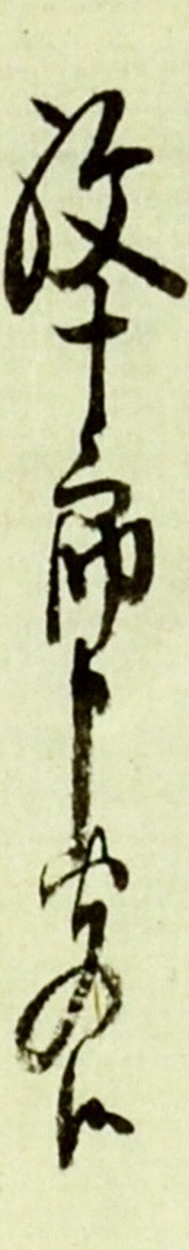紋十郎申聞候
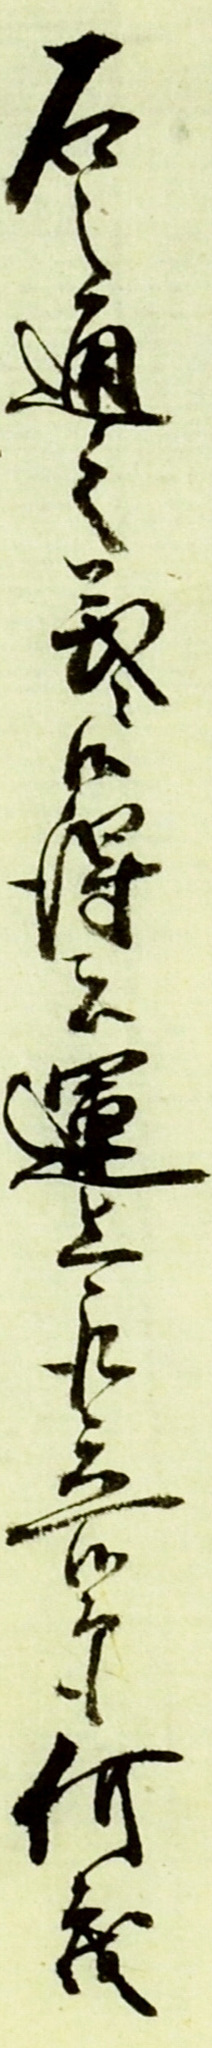右之通之義ニ候得者運上取立候而も何茂
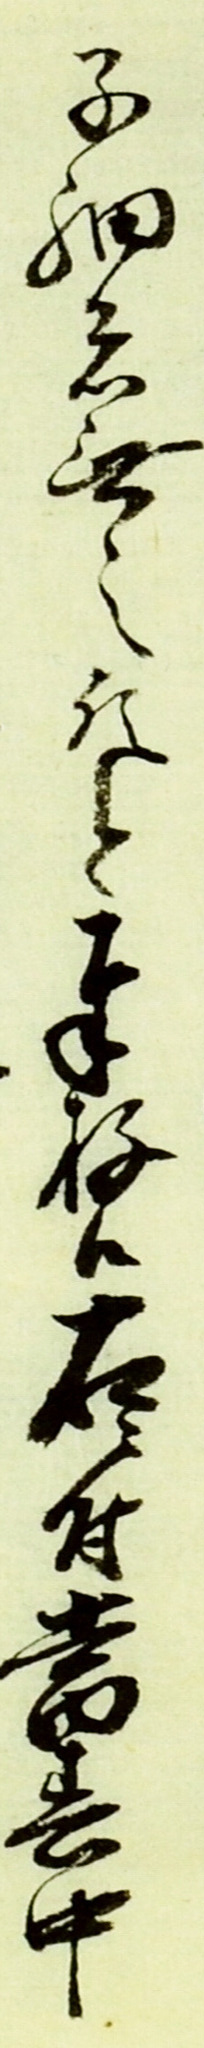子細者無之やと奉存候右ニ付当春中
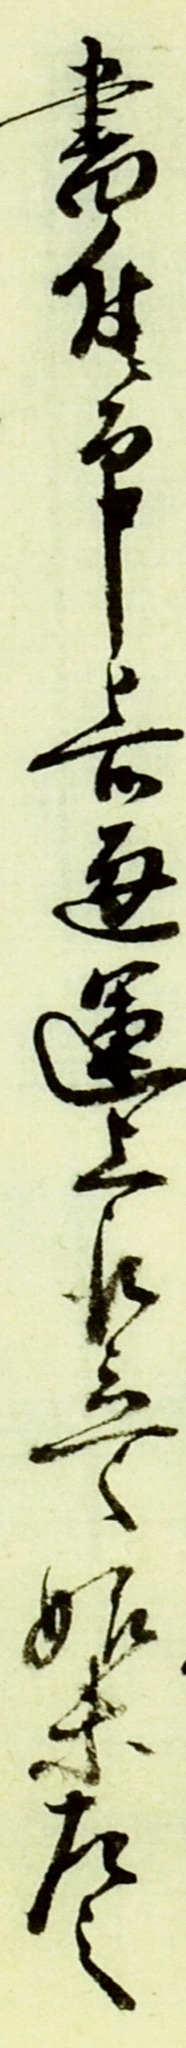書付ニ而申上候通運上取立候始末左之
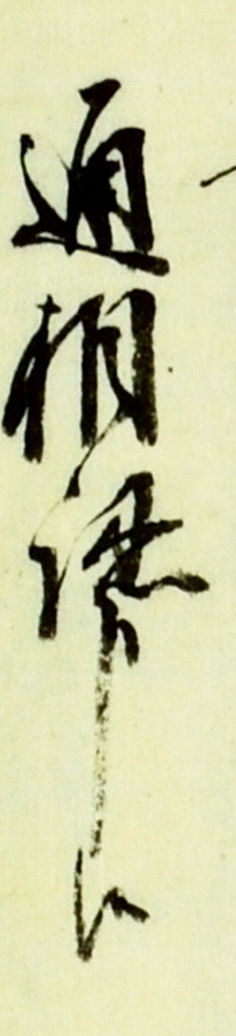通相認申候
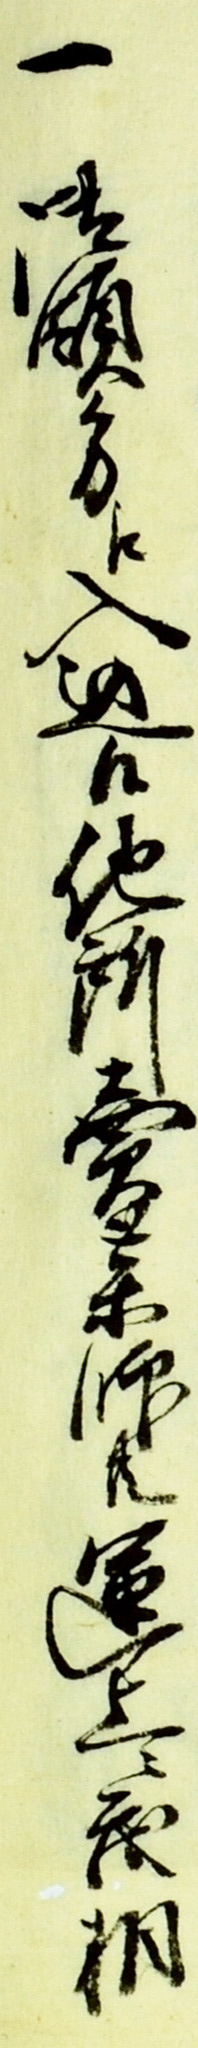一御領分江入込他所売薬師共運上ニ茂相
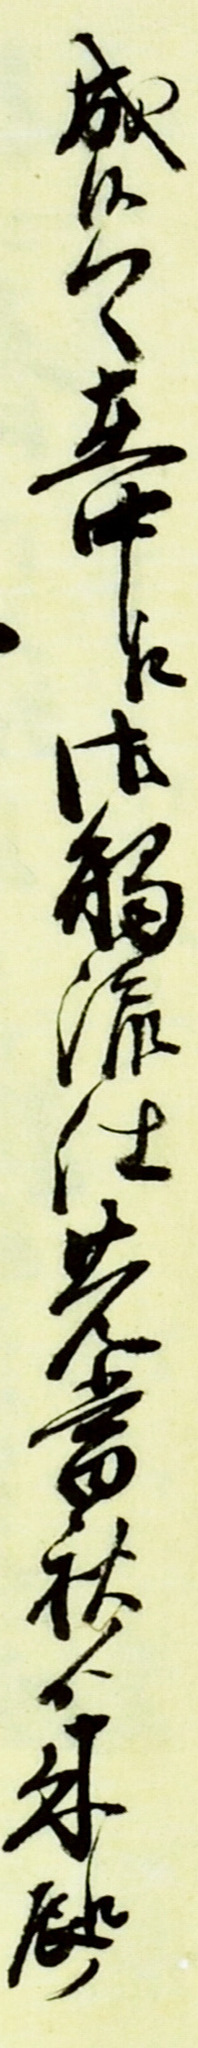成候ハヽ在中江御触流仕覚当秋ゟ来ル辰ノ
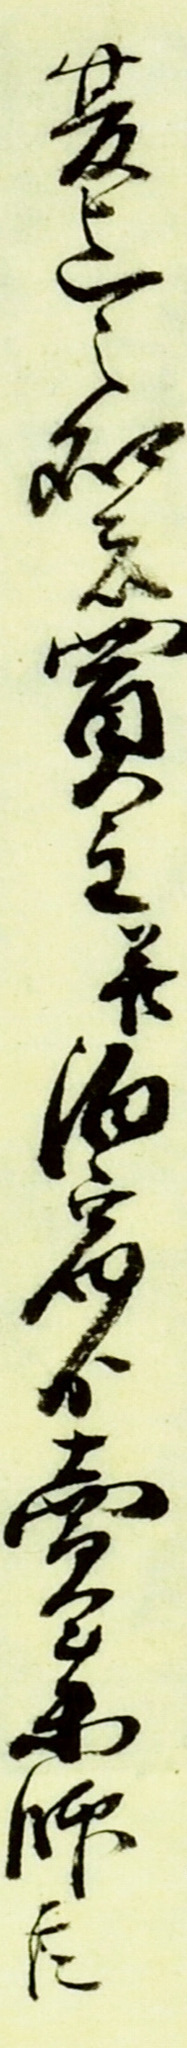夏迄之処者買主并泊宿ゟ売薬師共
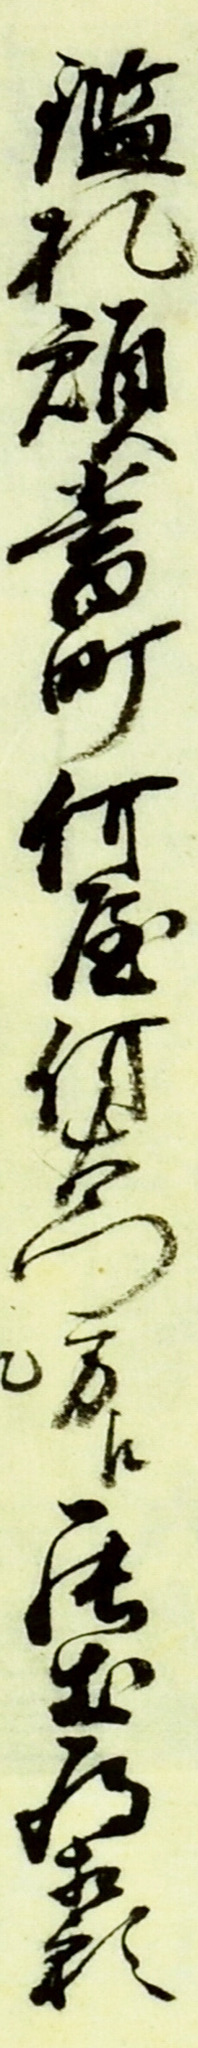鑑札願当町何屋何右衛門方江罷出為相願
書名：他国賣薬師運上之事
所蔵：伊那市立高遠町図書館・合同会社AMANE
